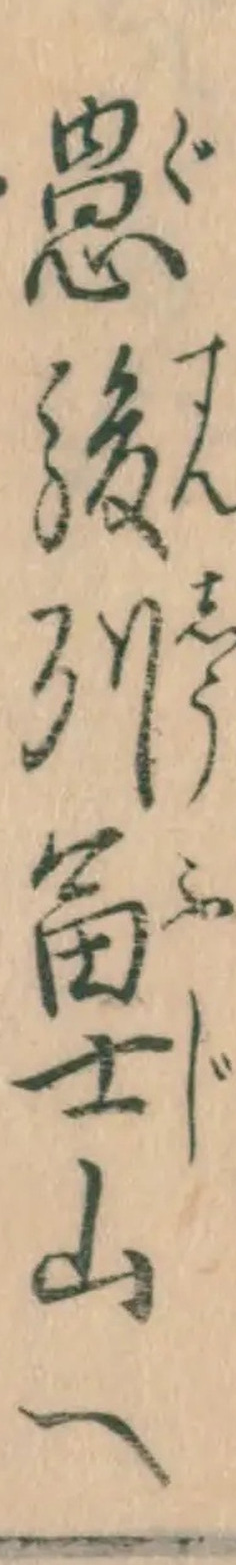愚駿州冨士山へ
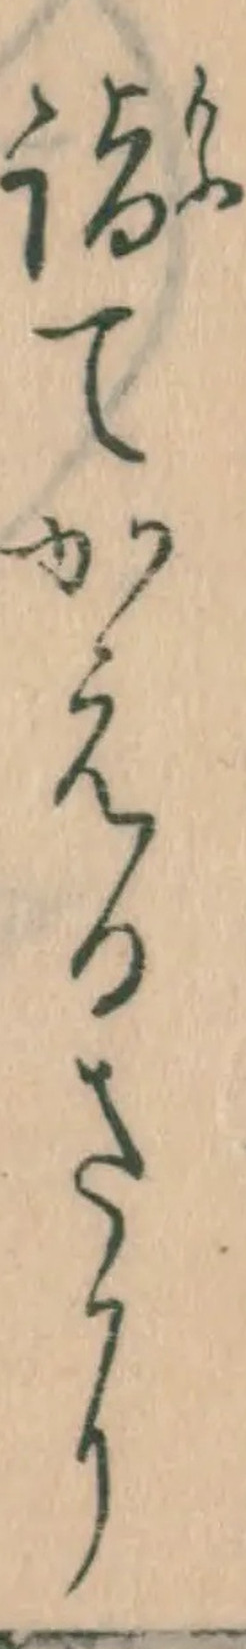詣てかえるさに
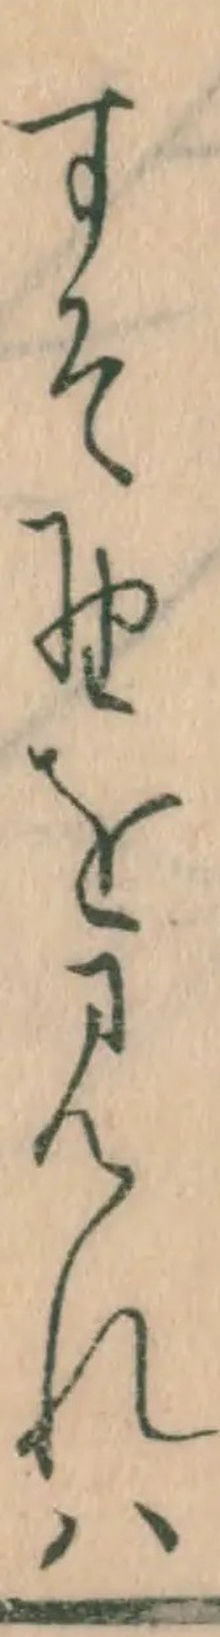すそ野を見れは
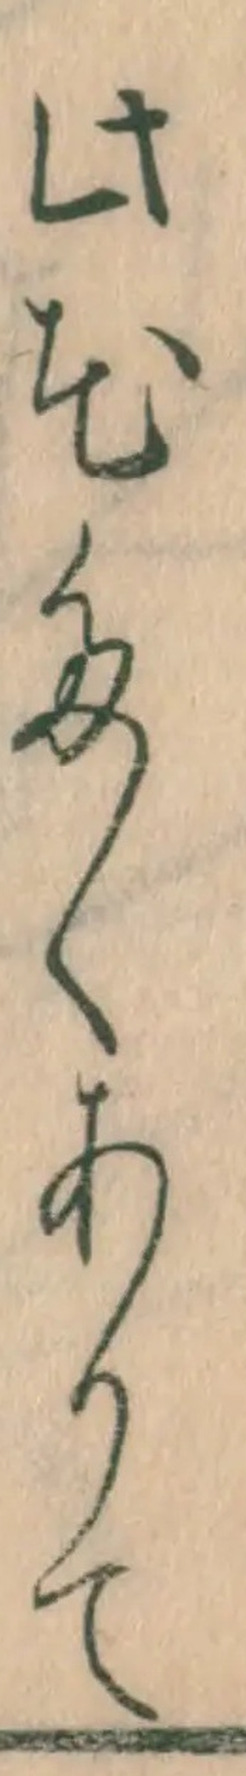此花多くありて
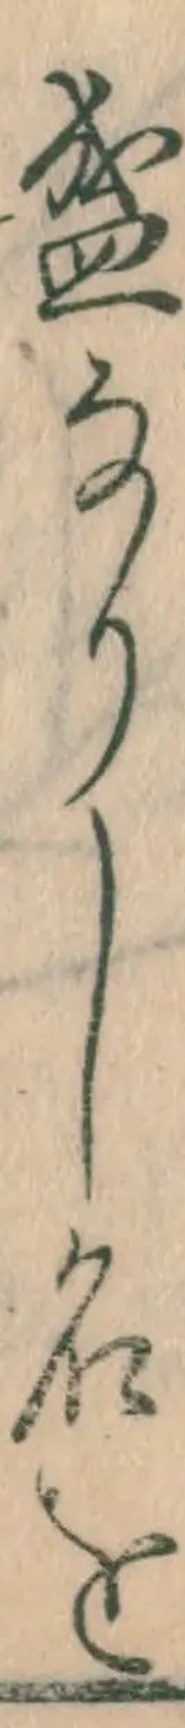盛なりし名を
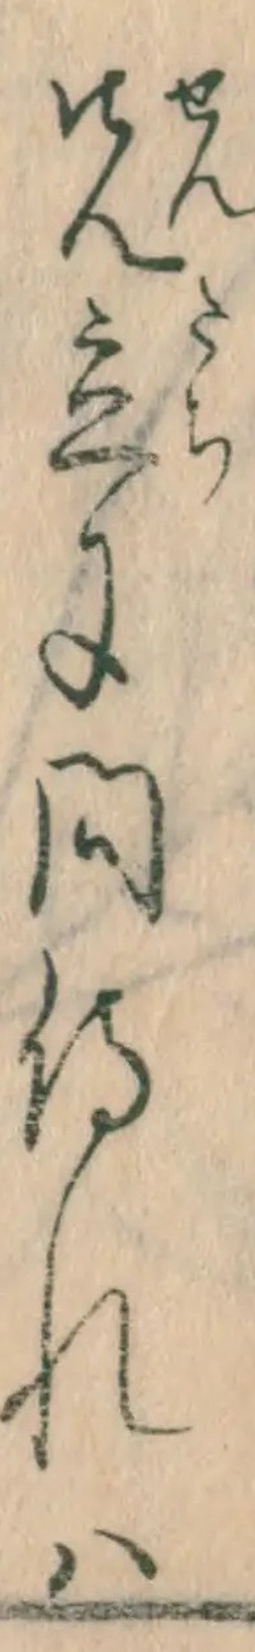先立に問侍れは
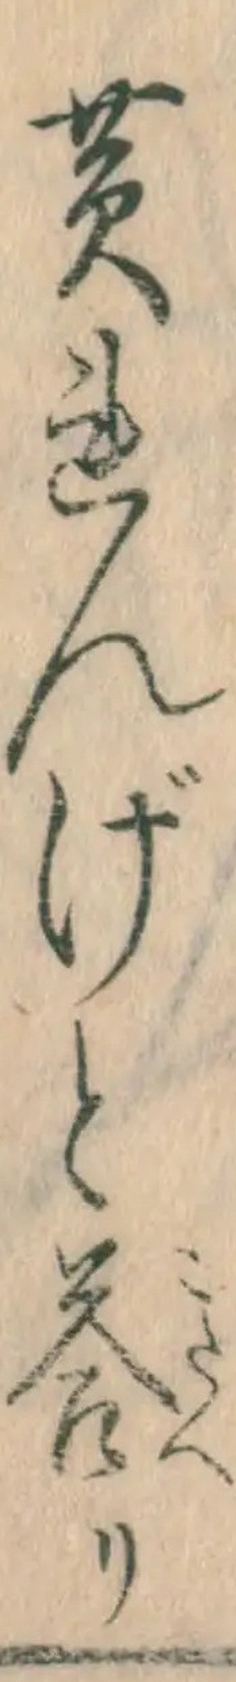黄れんげと答り
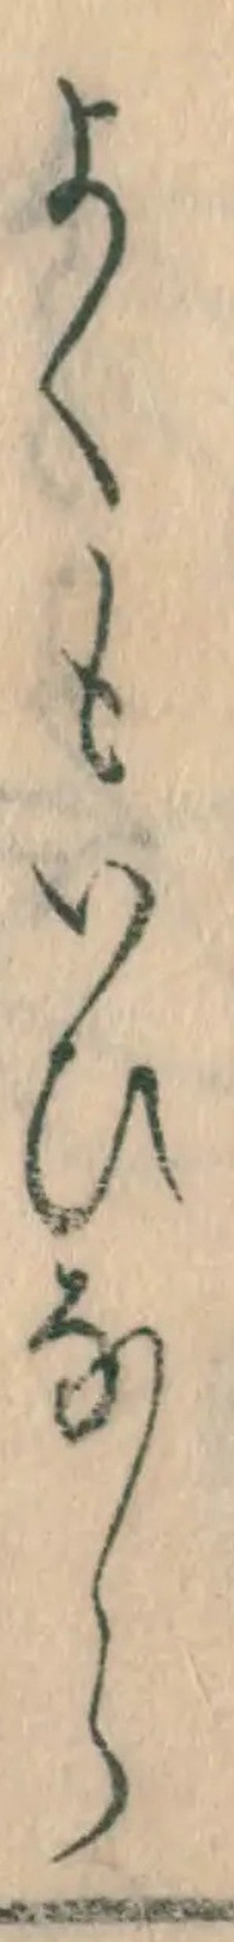よくもいひなら
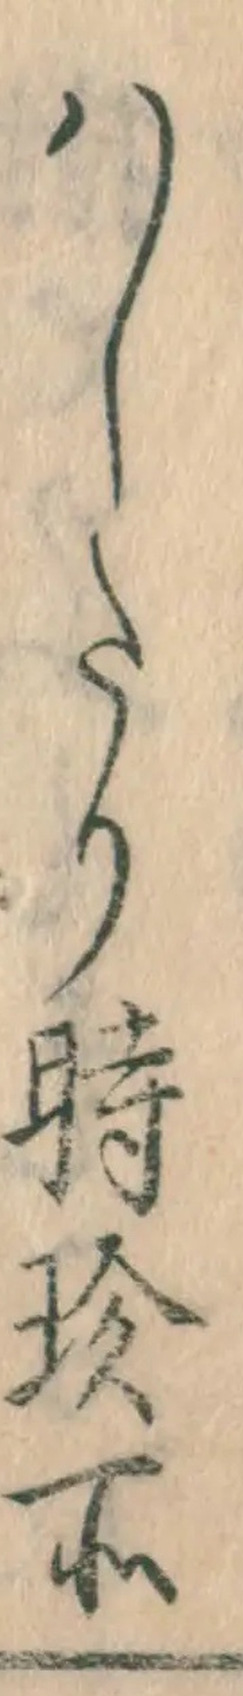はしたり時珍所
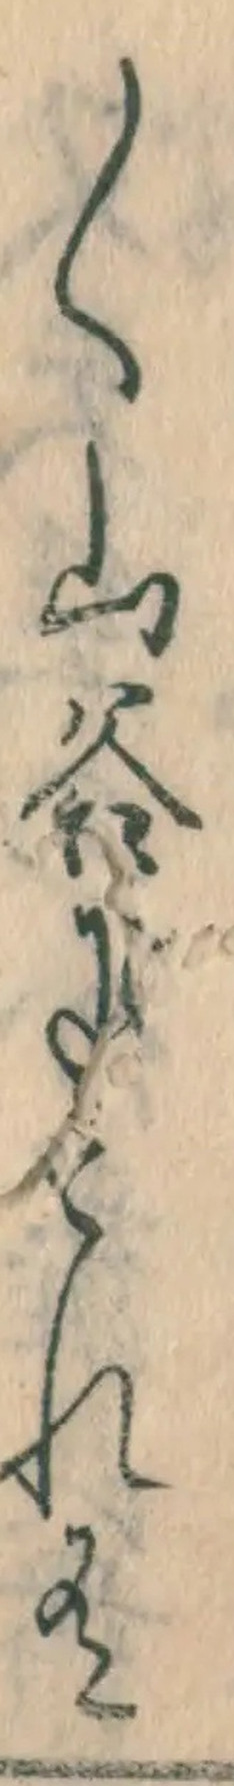〳〵山谷にれ有
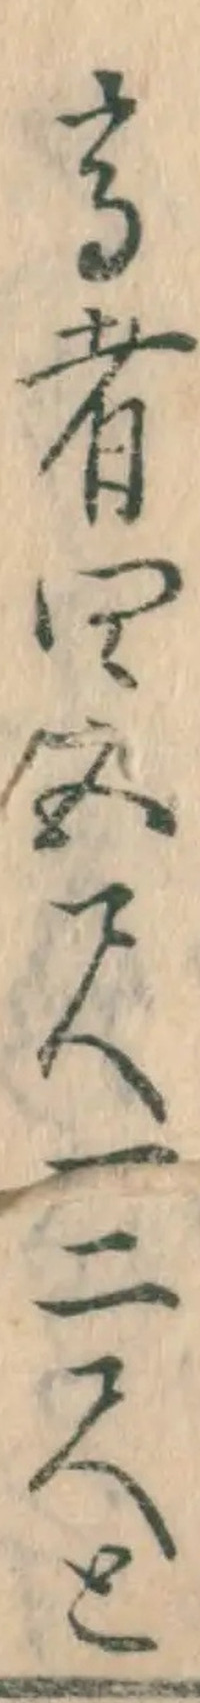高者四五尺一二尺と

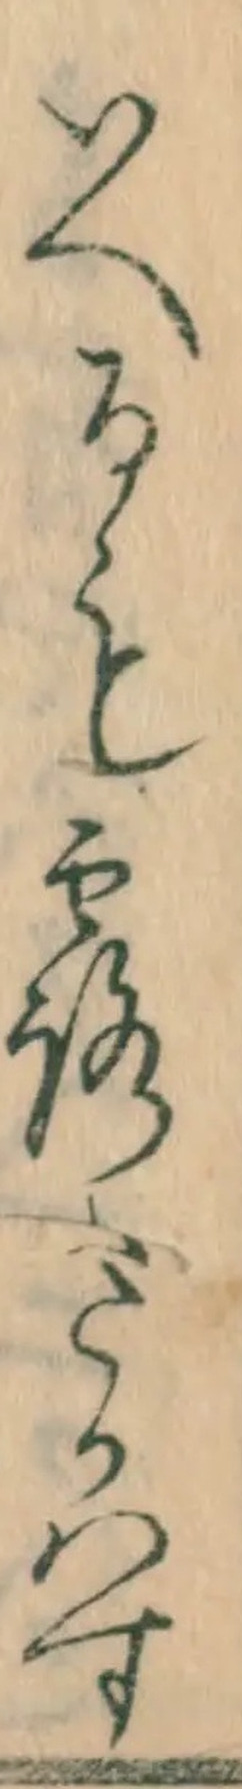いへるも露たかはす
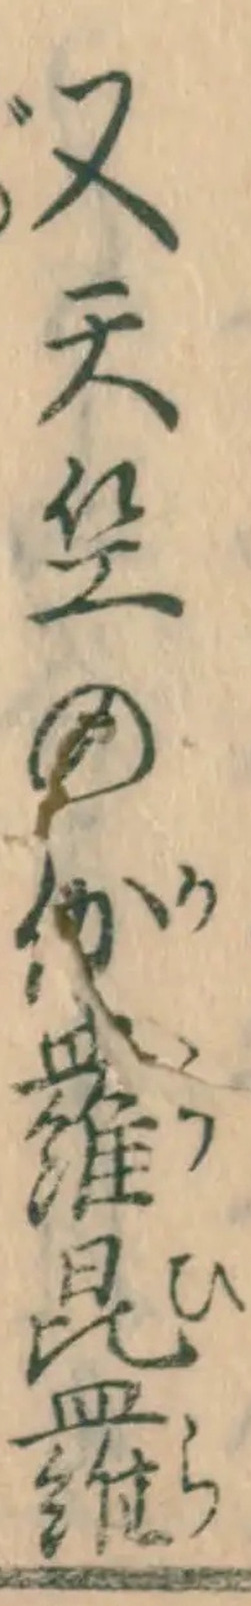又天竺の伽羅毘羅
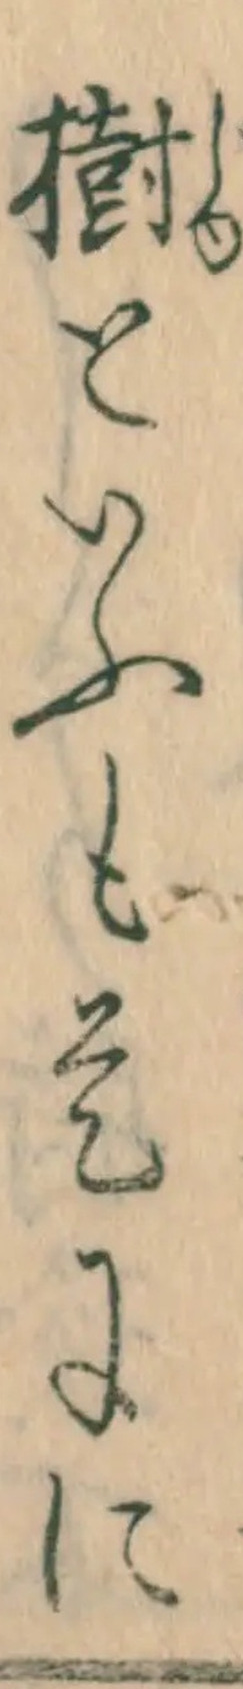樹といふも是にに
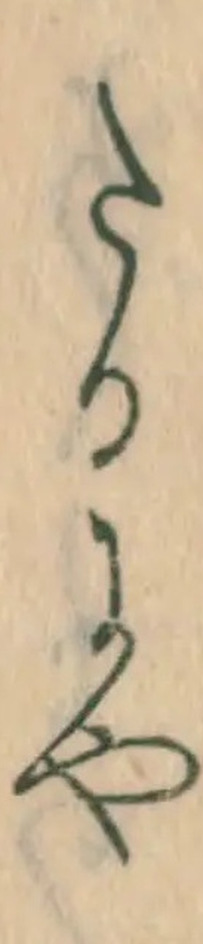たるにや
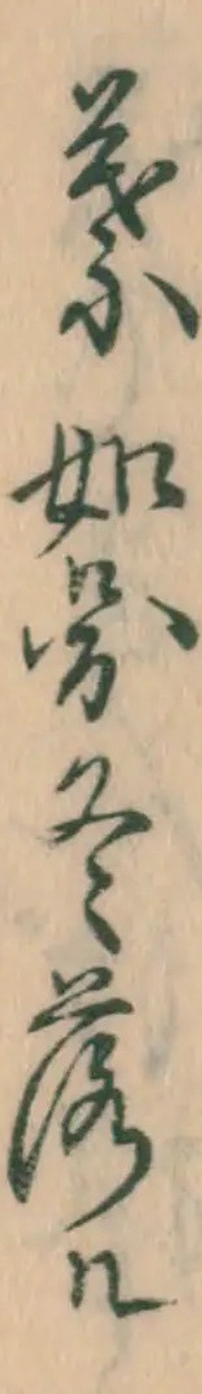葉如図冬落
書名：錦繍枕 5巻. [3]
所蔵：国立国会図書館 National Diet Library, JAPAN
